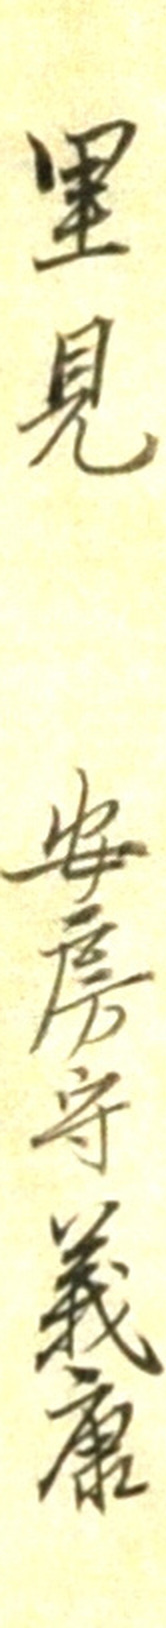里見安房守義康
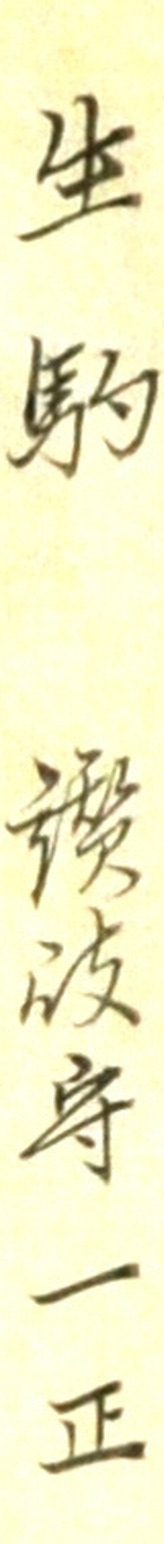生駒讃岐守一正
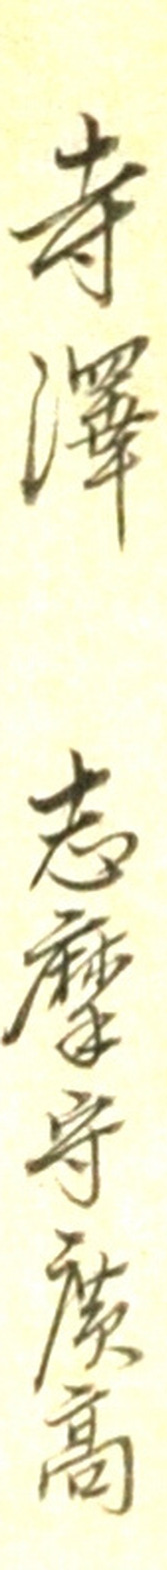寺沢志摩守広高
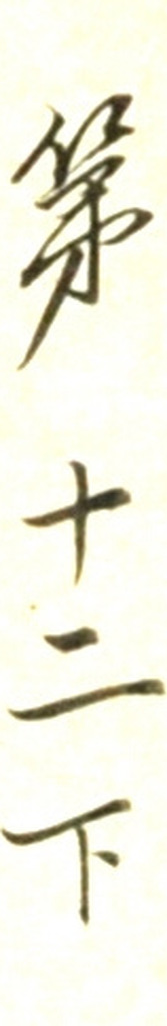第十二下
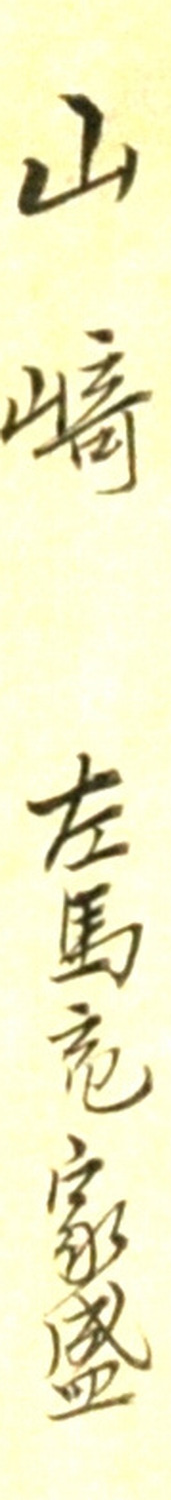山崎左馬亮家盛

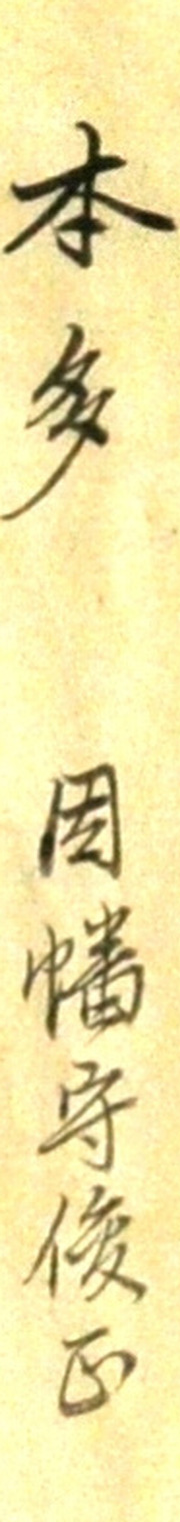本多因幡守俊正
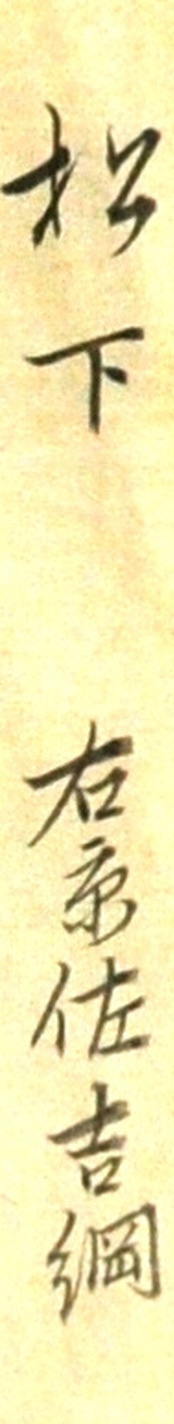松下右京佐吉綱
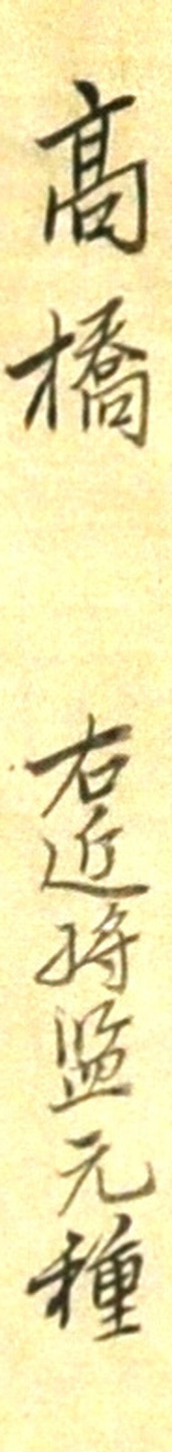高橋右近将監元種
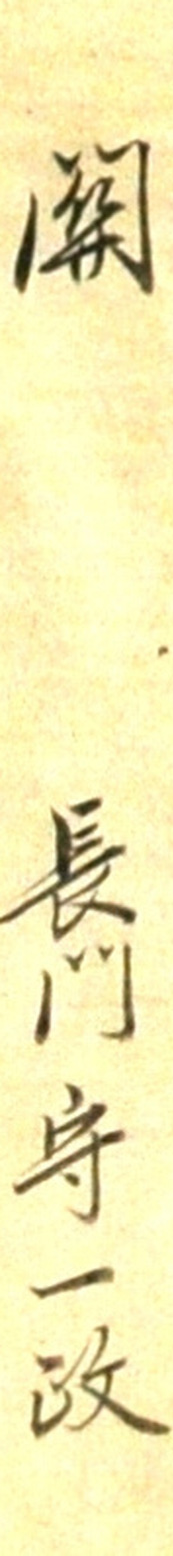関長門守一政
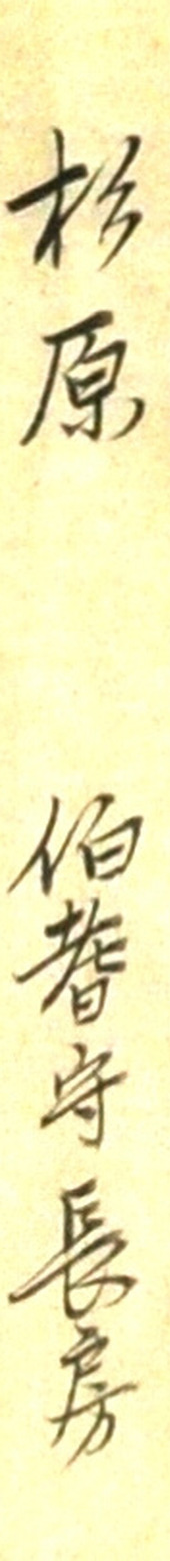杉原伯耆守長房
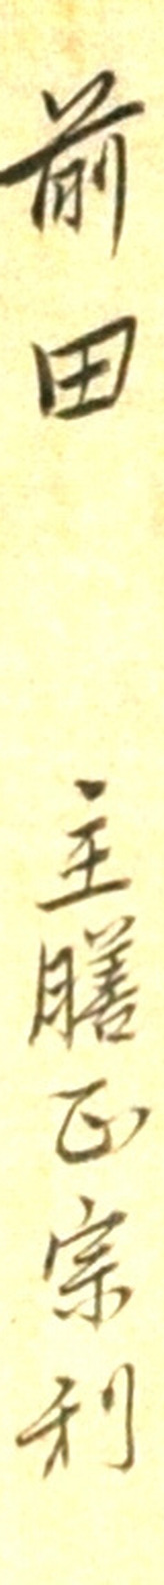前田主膳正宗利
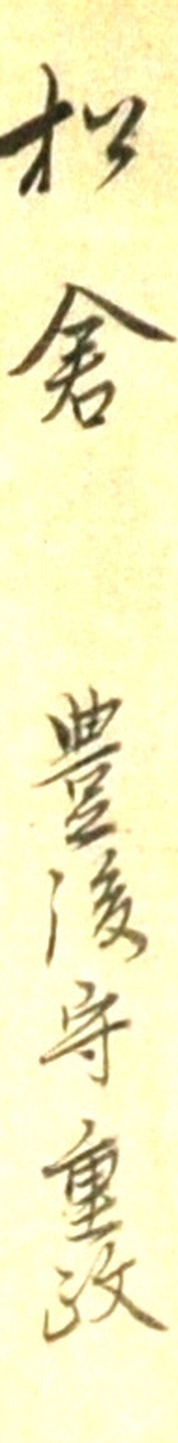松倉豊後守重政
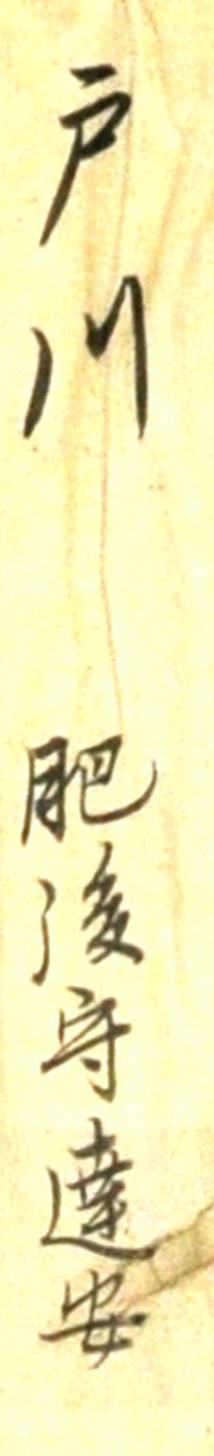戸川肥後守達安
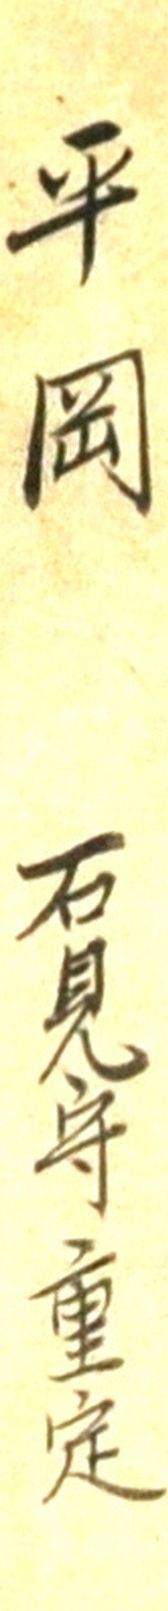平岡石見守重定
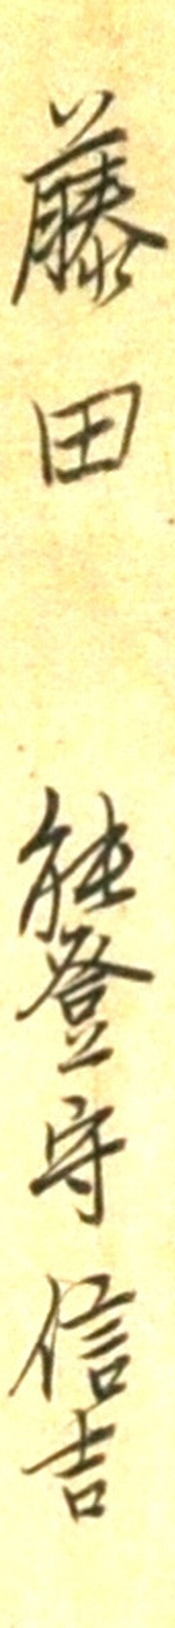藤田能登守信吉
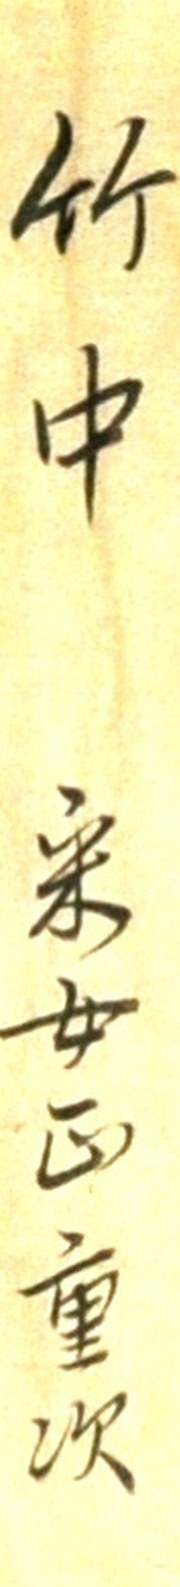竹中采女正重次
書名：藩翰譜（一）
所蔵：伊那市立高遠町図書館・合同会社AMANE
